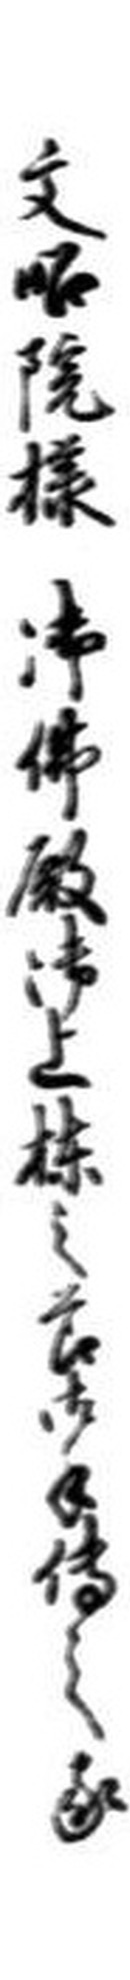文昭院様御仏殿御上棟之節御手伝之家
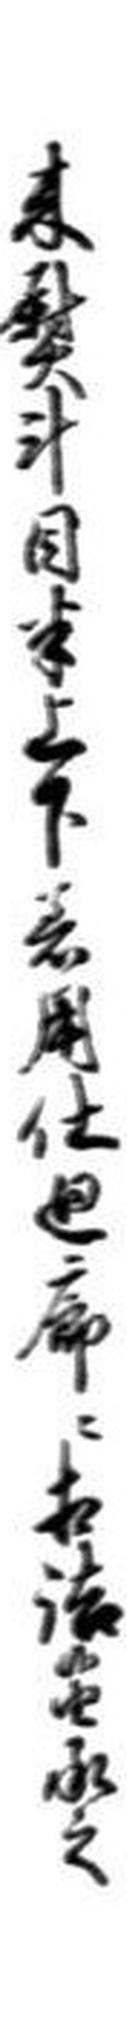来熨斗目半上下着用仕廻廊ニ相詰候由承之
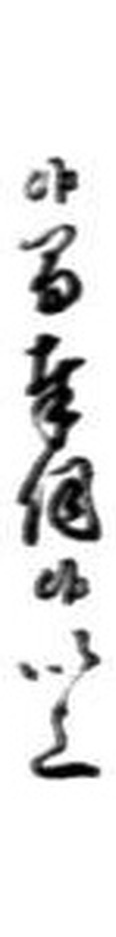候間奉伺候以上
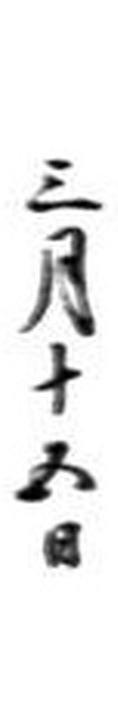三月十四日
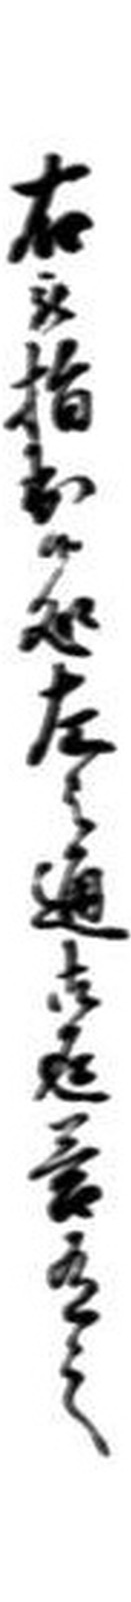右被指出候処左之通御返答有之
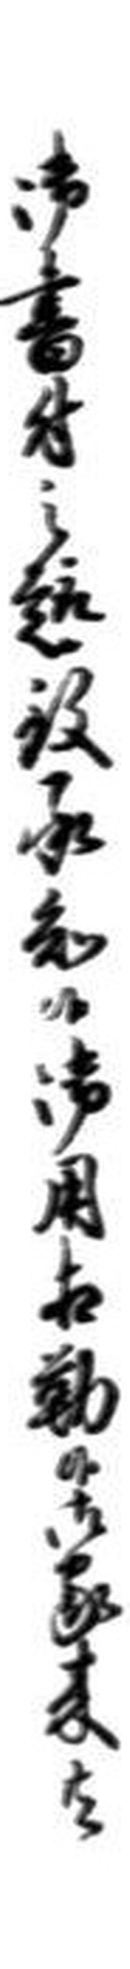御書付之趣致承知候御用相勤候御家来共
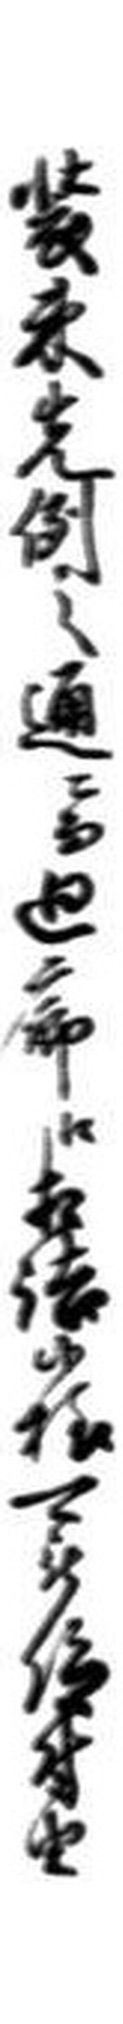装束先例之通ニ而廻廊江相詰候様可被仰付由

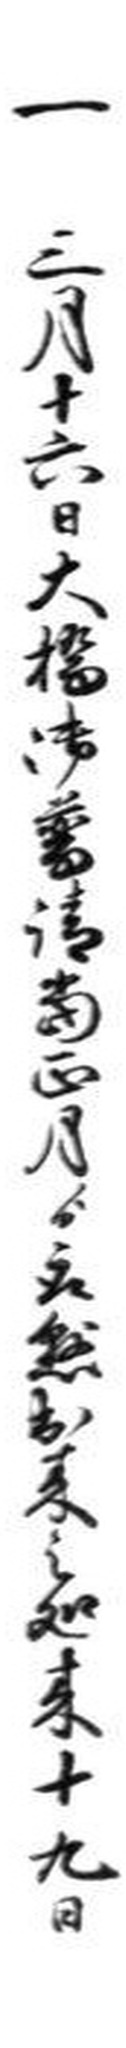一三月十六日大橋御普請当正月ゟ取懸出来之処来十九日
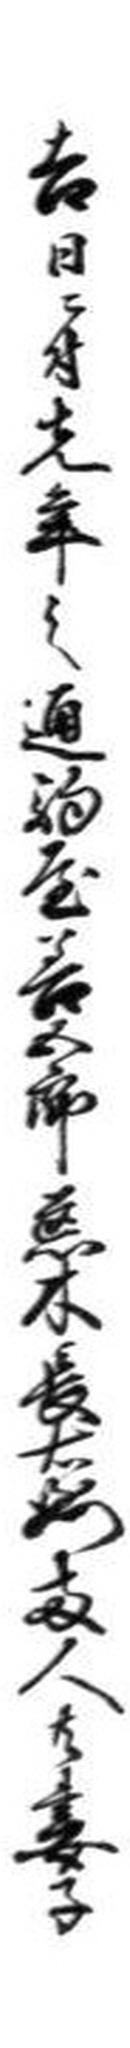吉日ニ付先年之通駒屋善五郎荒木長右衛門両人共妻子
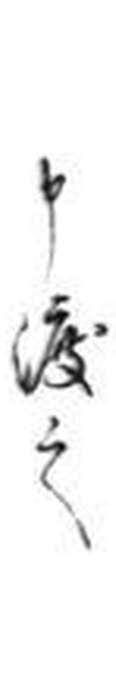申渡之
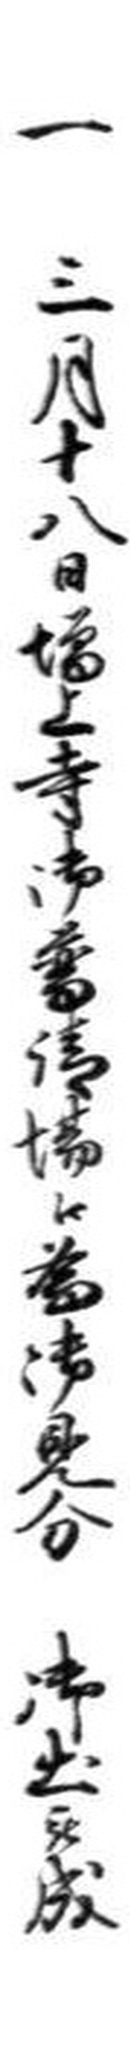一三月十八日増上寺御普請場江為御見分御出被成
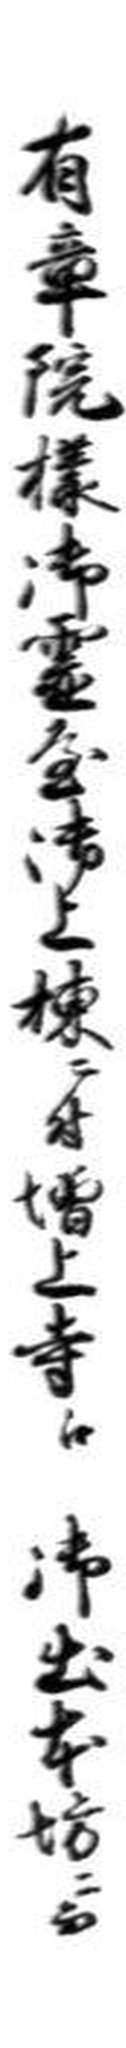有章院様御霊屋御上棟ニ付増上寺江御出本坊ニ而
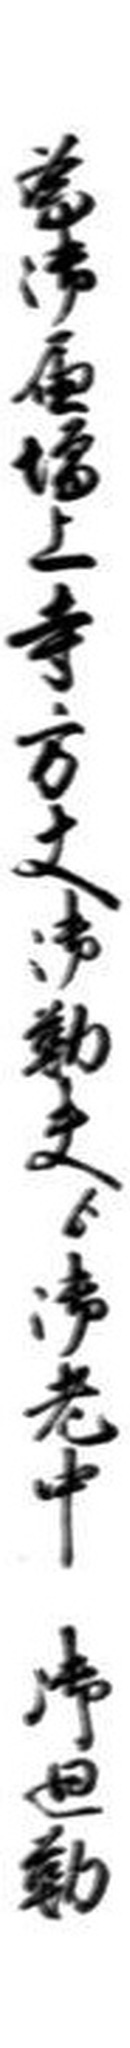為御届増上寺方丈御勤夫ゟ御老中御廻勤
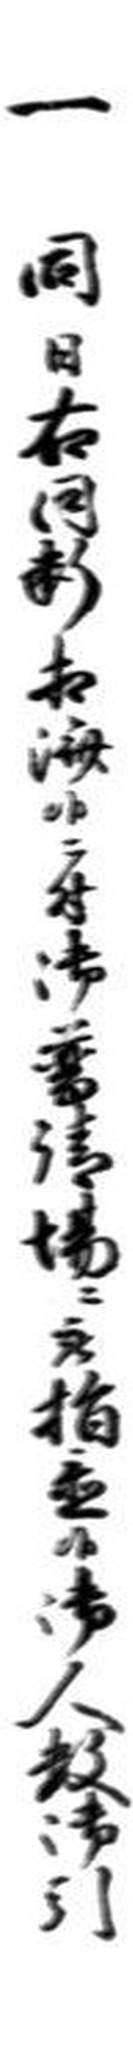一同日右同断相済候ニ付御普請場ニ被指置候御人数御引
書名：家譜 三十二 吉邦公 従享保二年到享保三年
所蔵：福井県文書館 Fukui Prefectural Archives
